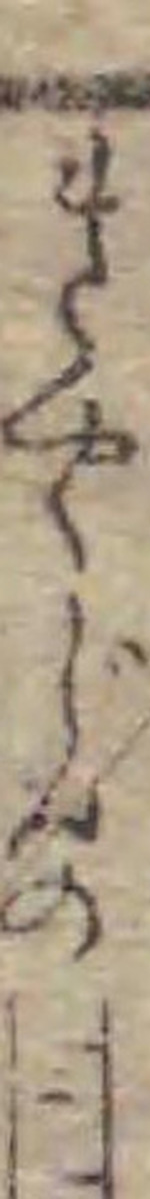きやくじんの
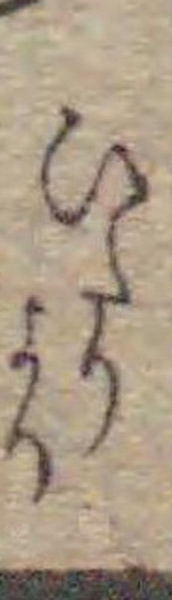ひたり
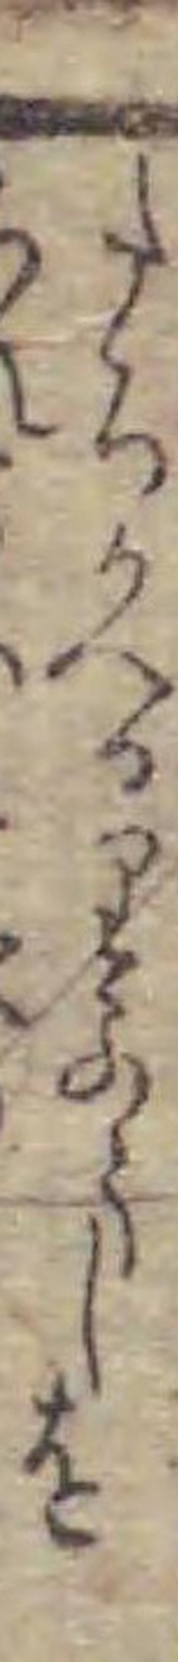たちかへるりようしを
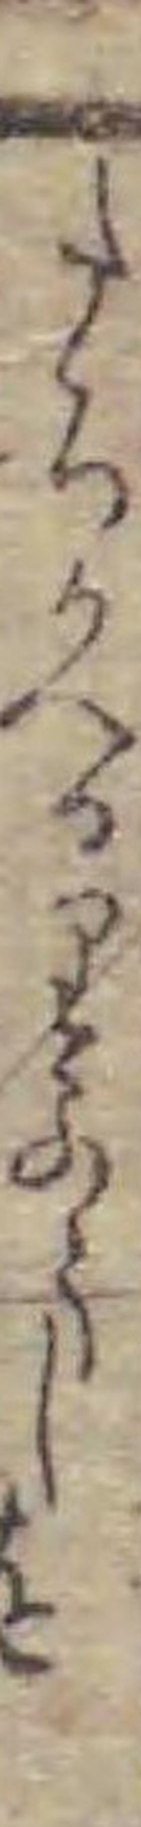たちかへるりようしを
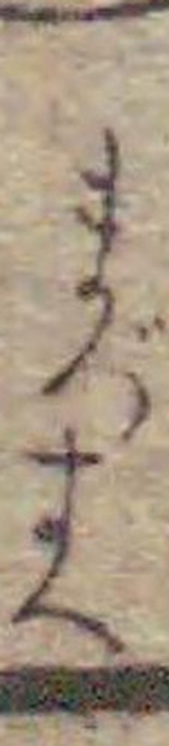まづすへ
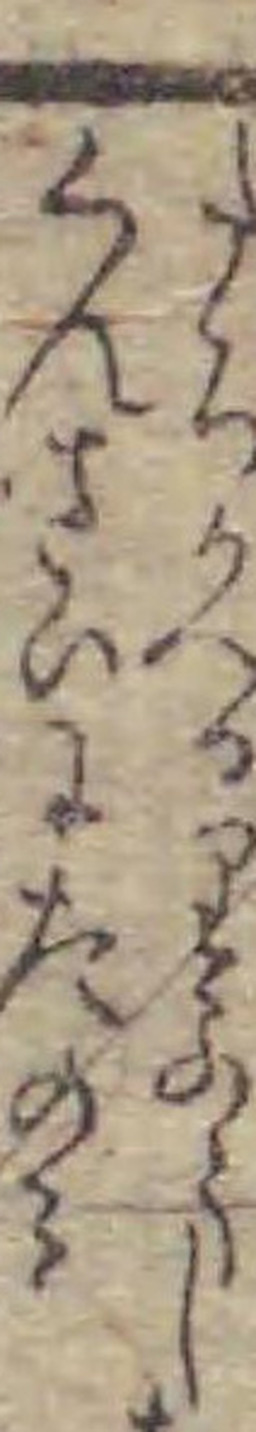くんさいにたのみ
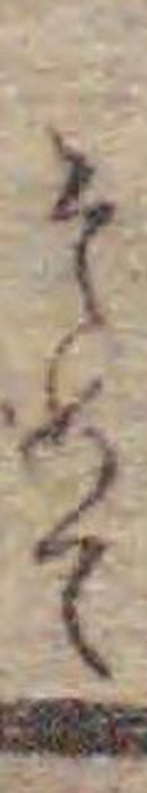そめて
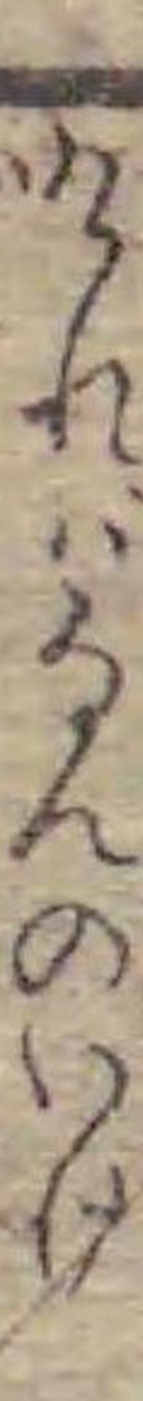ければなんのいけ
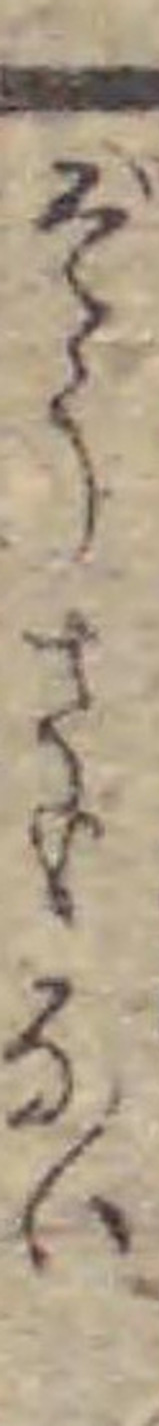ぞうさもない
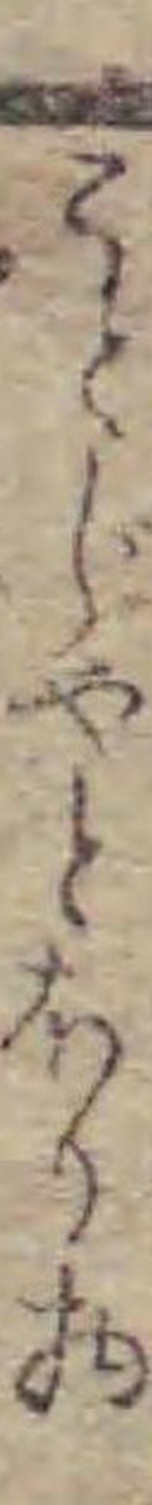ことじやとほり物
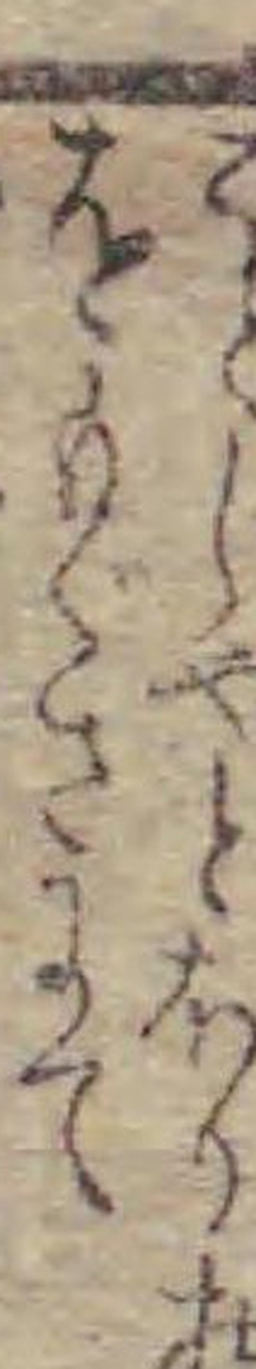をもぐさにて
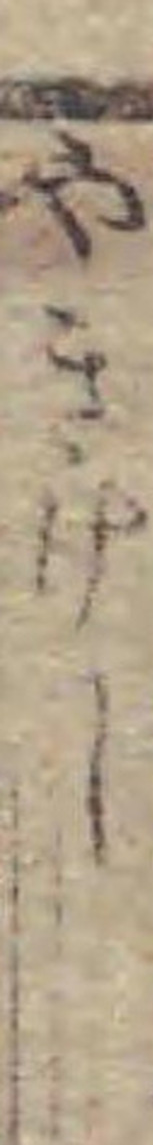やきけし
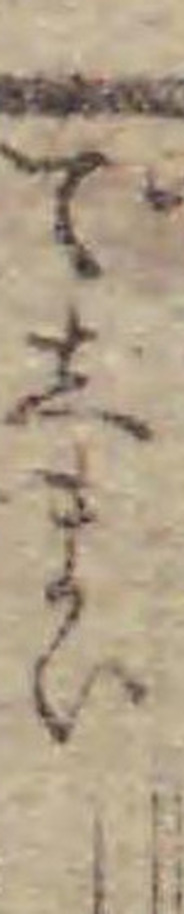てしまい
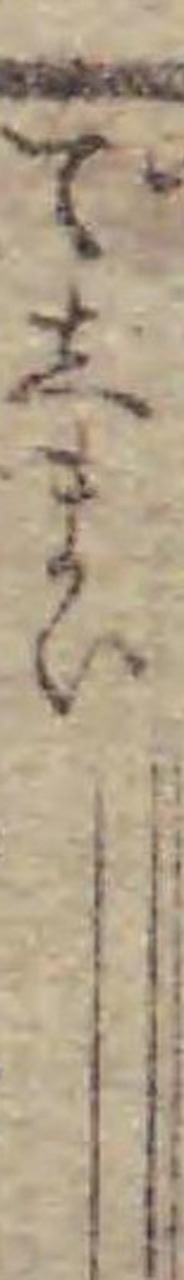てしまい
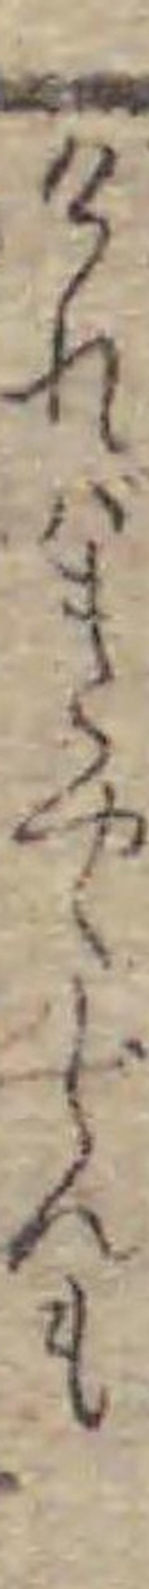ければきやくじんも
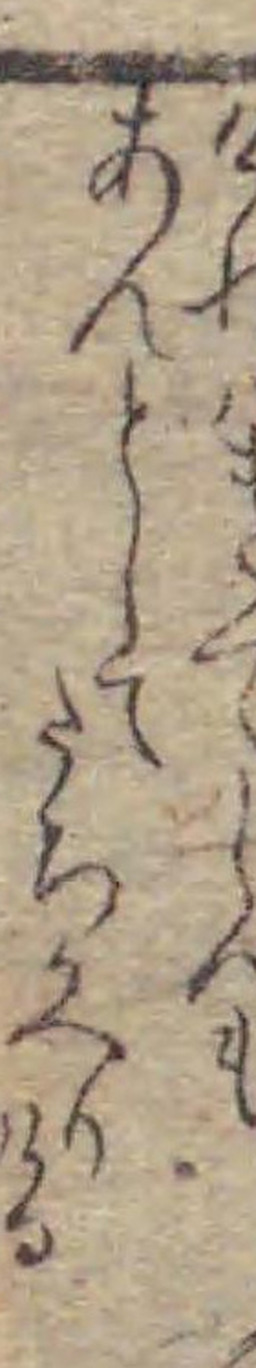あんとしてたちかへりける
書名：江戸花俳優贔屓 : 3巻
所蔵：国立国会図書館 National Diet Library, JAPAN
